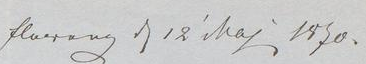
Florenz den 12t Maj 1870.
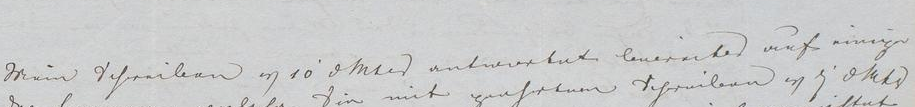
Mein Schreiben vom 10t dMts antwortet bereits auf einige
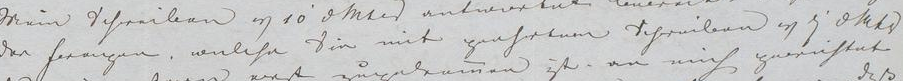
der Fragen, welche Sie mit geehrtem Schreiben vom 7t dMts
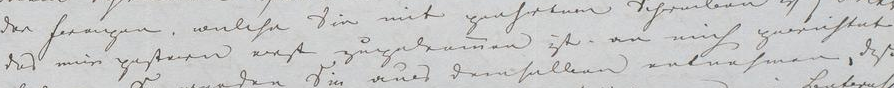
das mir gestern erst zugekommen ist – an mich gerichtet
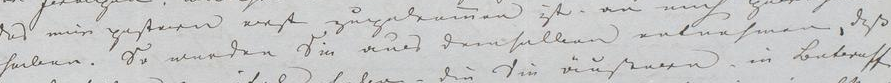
haben. So werden Sie aus demselben entnehmen, daß
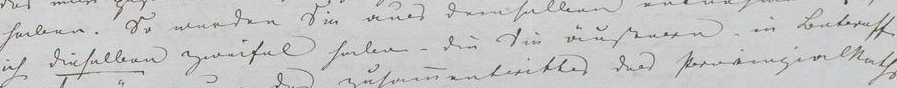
ich dieselben Zweifel habe – die sie äußern – in Betreff
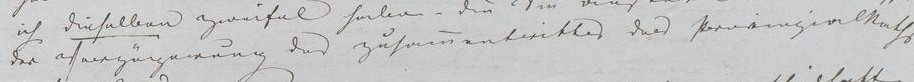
der Verzögerung des Zusammentritts des ProvinzialRaths
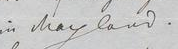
in Mayland.
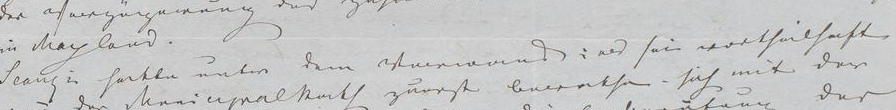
Scanzi hatte unter dem Vorwand: es sei vortheilhaft
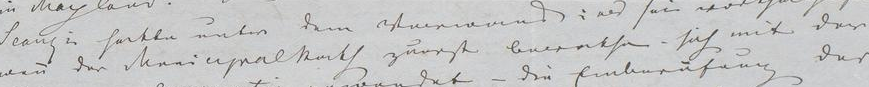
wenn der MunicipalRath zuerst berathe – sich mit der
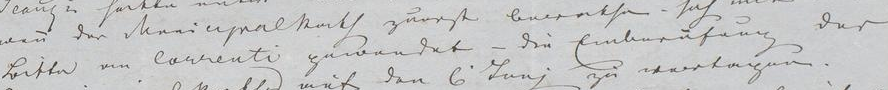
Bitte an Correnti gewendet – die Einberufung des
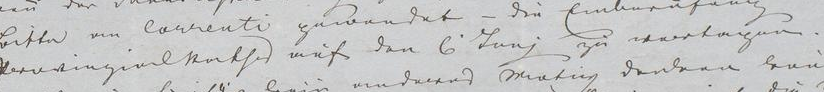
ProvinzialRaths auf den 6t Junj zu vertagen.
